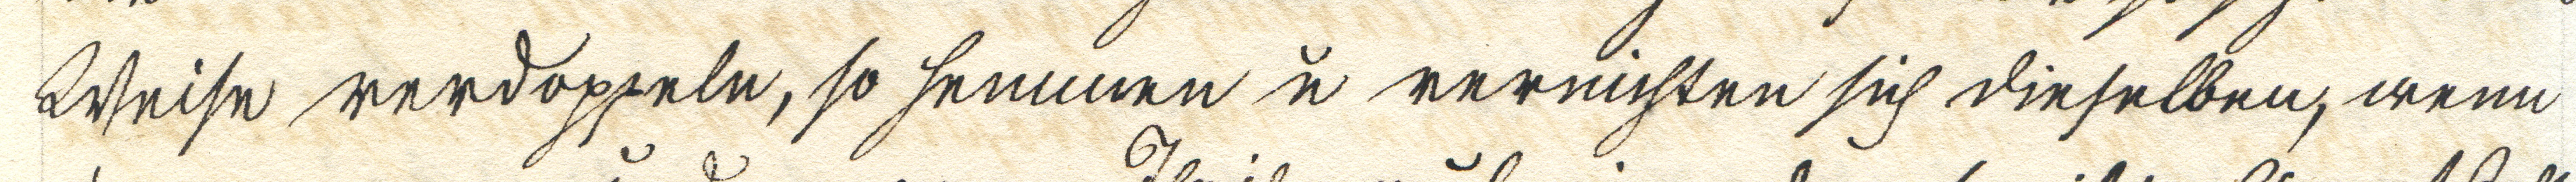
Weise verdoppeln, so hemmen u vernichten sich dieselben, wenn
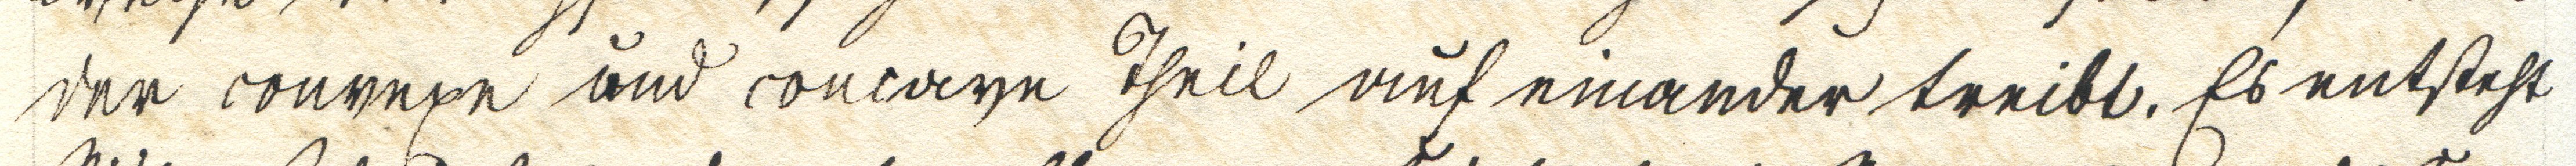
der convexe und concave Theil auf einander treibt. Es entsteht
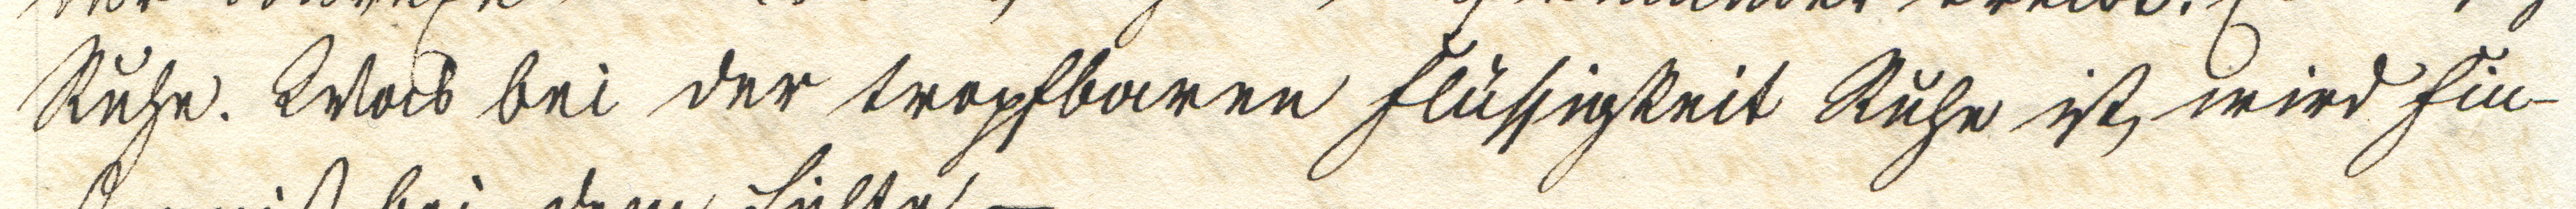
Ruhe. Was bei der tropfbaren Flüssigkeit Ruhe ist, wird Fin-
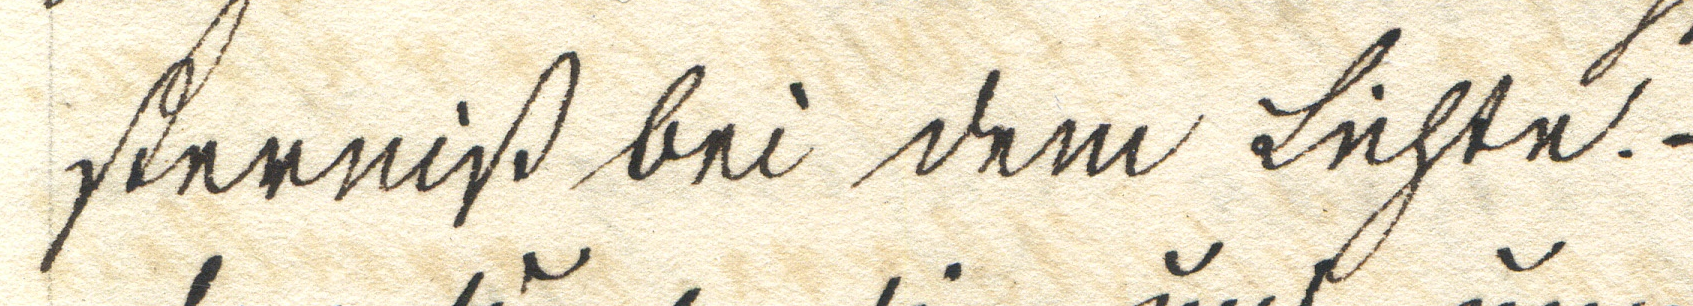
sterniß bei dem Lichte. –
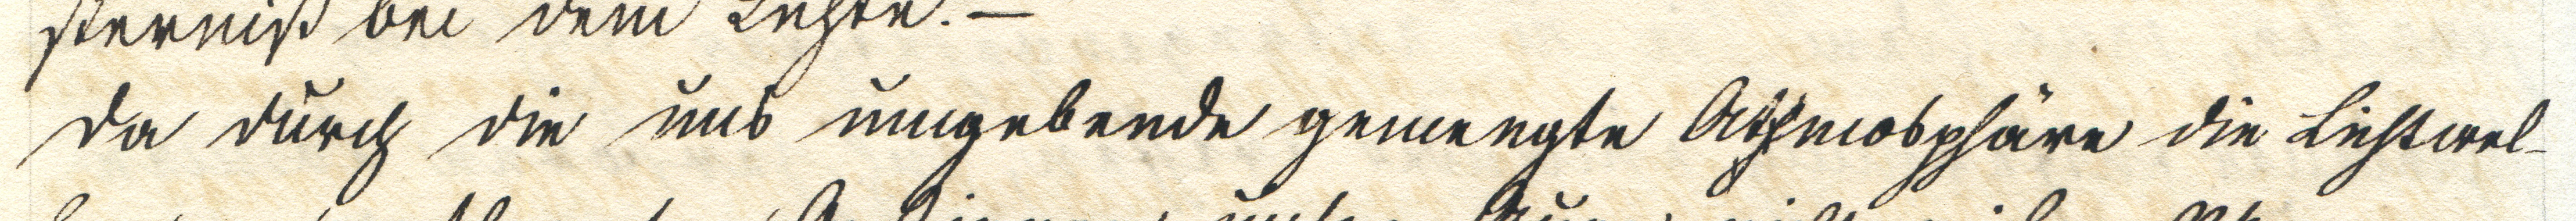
Da durch die uns umgebende gemengte Athmosphäre die Lichtwel-
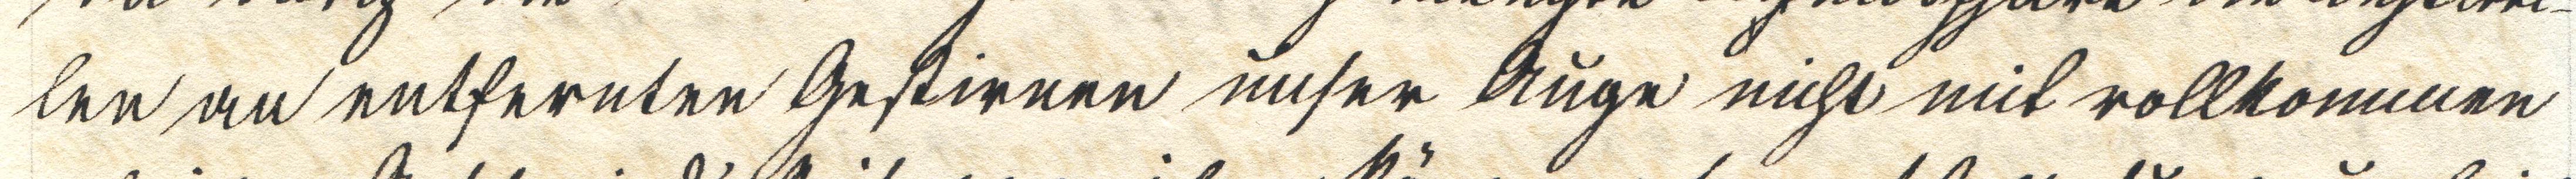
len an entfernten Gestirnen unser Auge nicht mit vollkommen
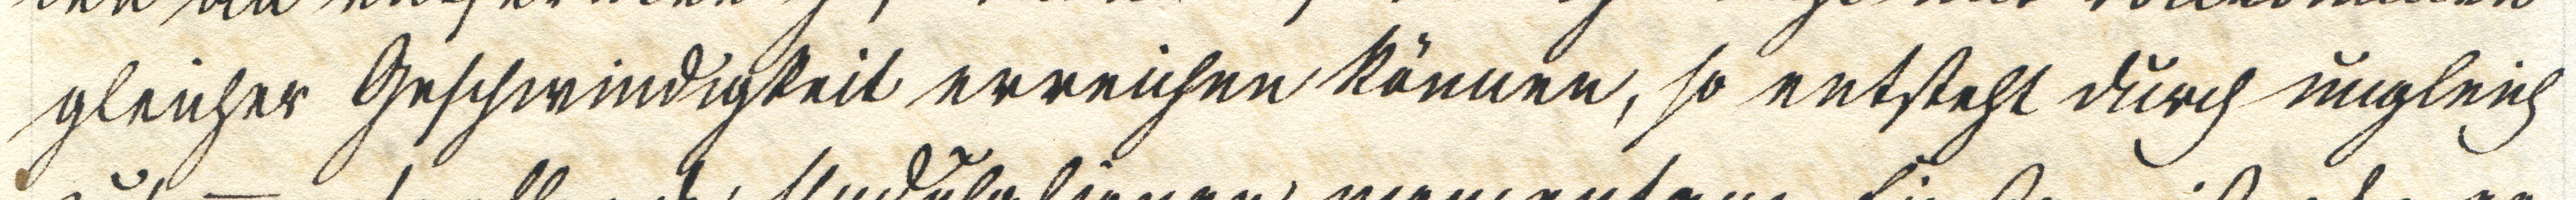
gleicher Geschwindigkeit erreichen können, so entsteht durch ungleich
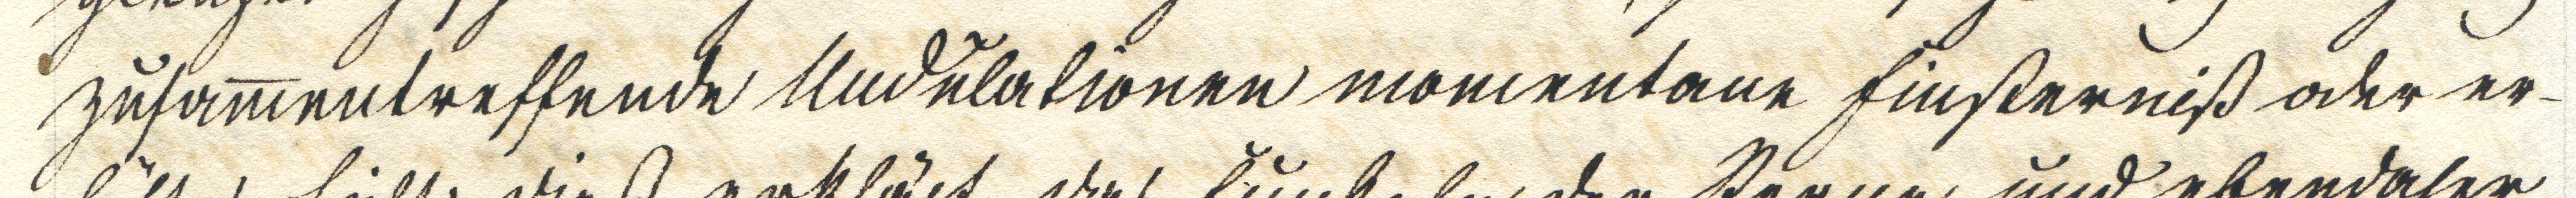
zusam̃entreffende Undulationen momentane Finsterniß oder er-
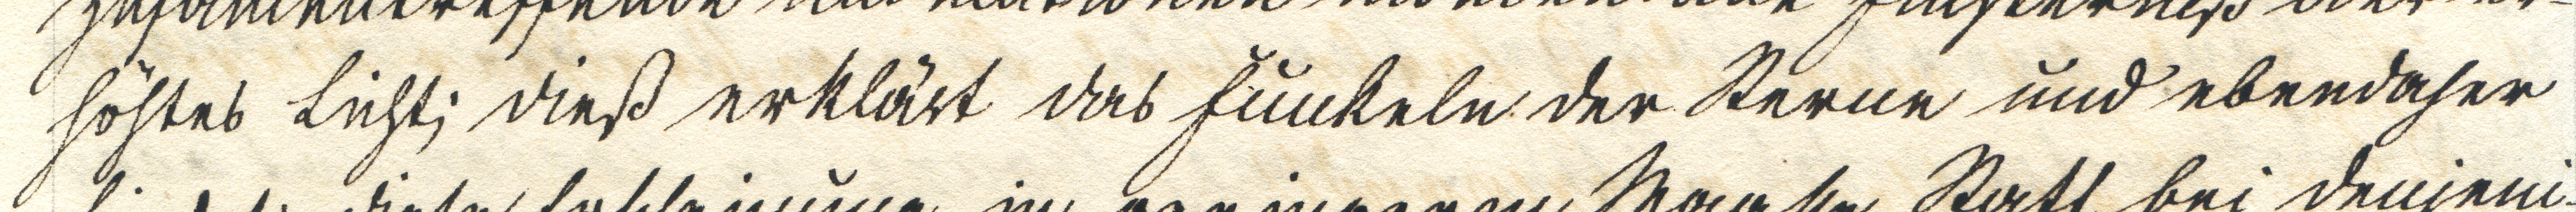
höhtes Licht; dieß erklärt das Funkeln der Sterne und ebendaher
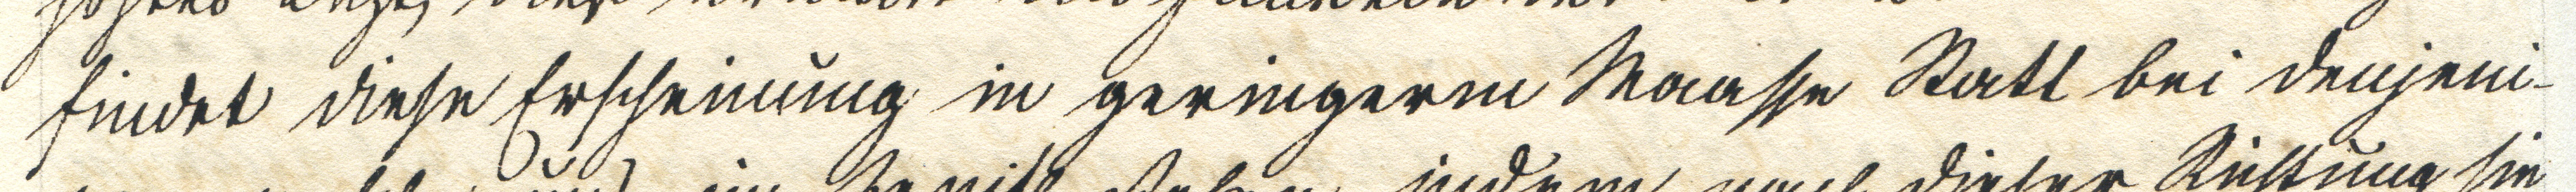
findet diese Erscheinung in geringerm Maasse Statt bei denjeni-
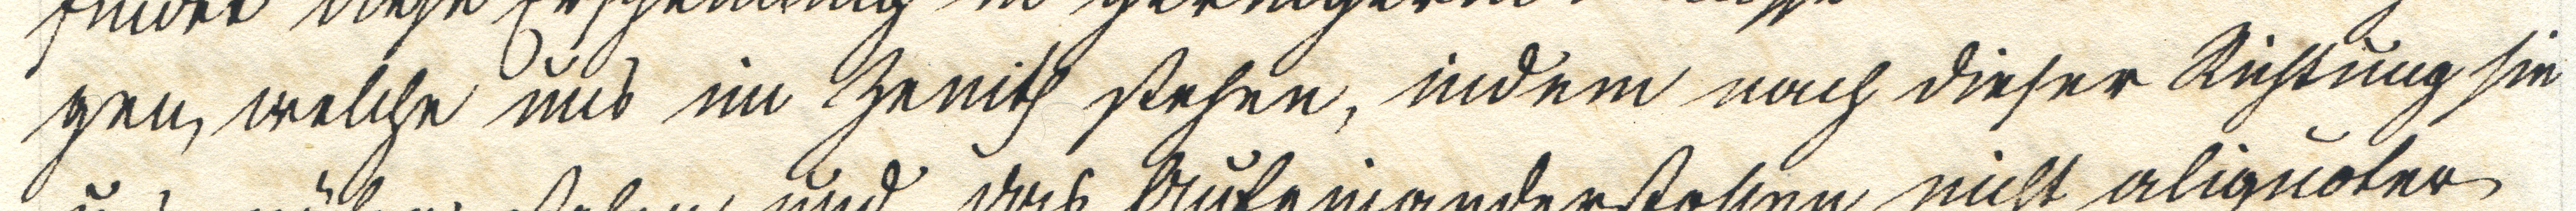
gen, welche uns im Zenith stehen, indem nach dieser Richtung sie
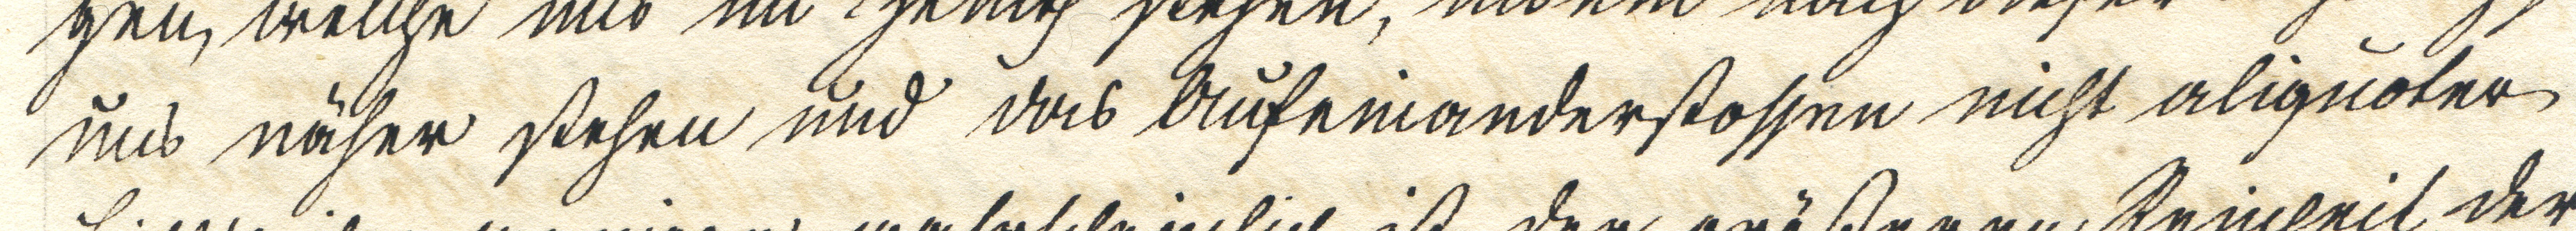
uns näher stehen und das Aufeinanderstossen nicht aliquoter
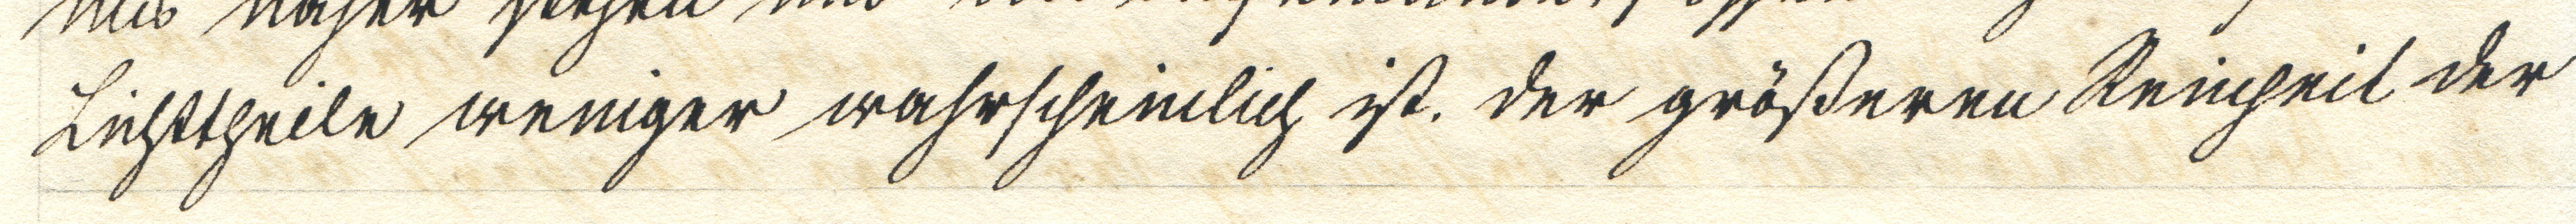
Lichttheile weniger wahrscheinlich ist. Der größeren Reinheit der
